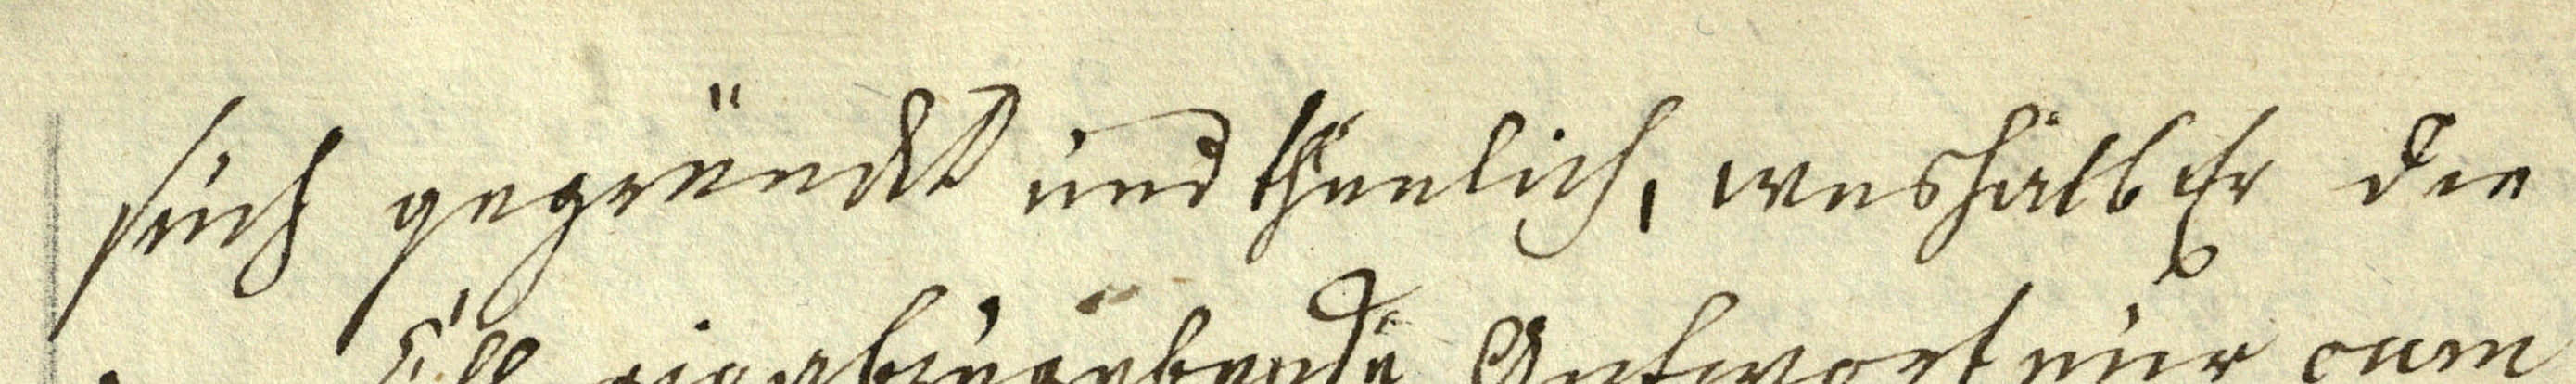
such gegründet und thunlich, weshalb Er die
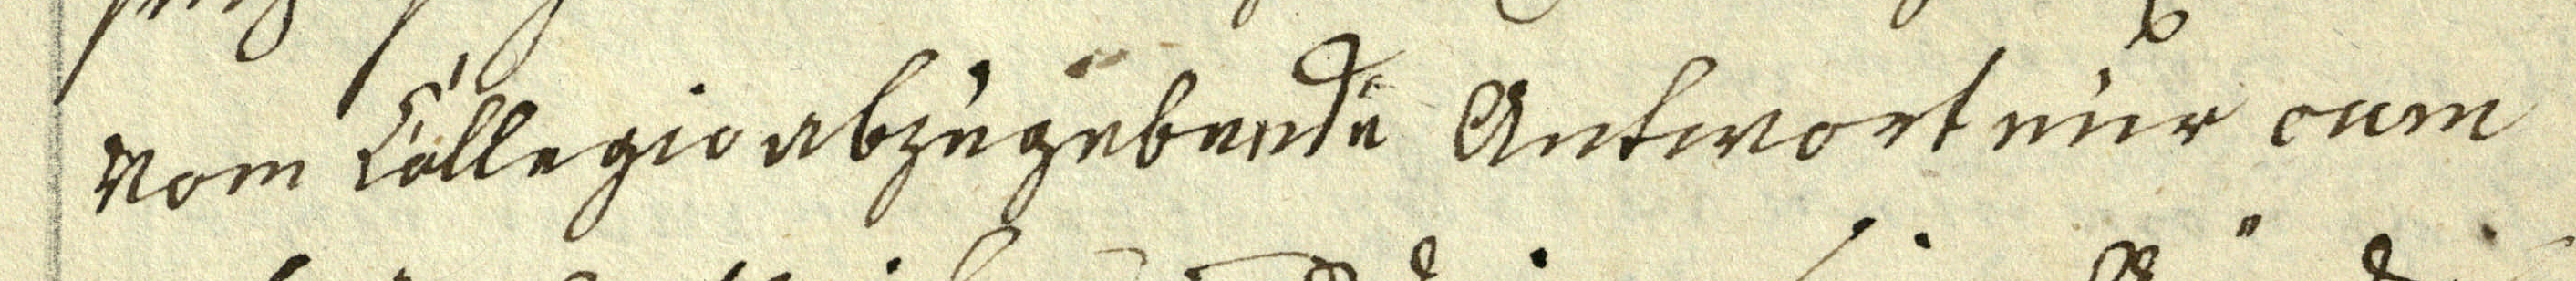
vom Collegio abzugebende Antwort nur cum
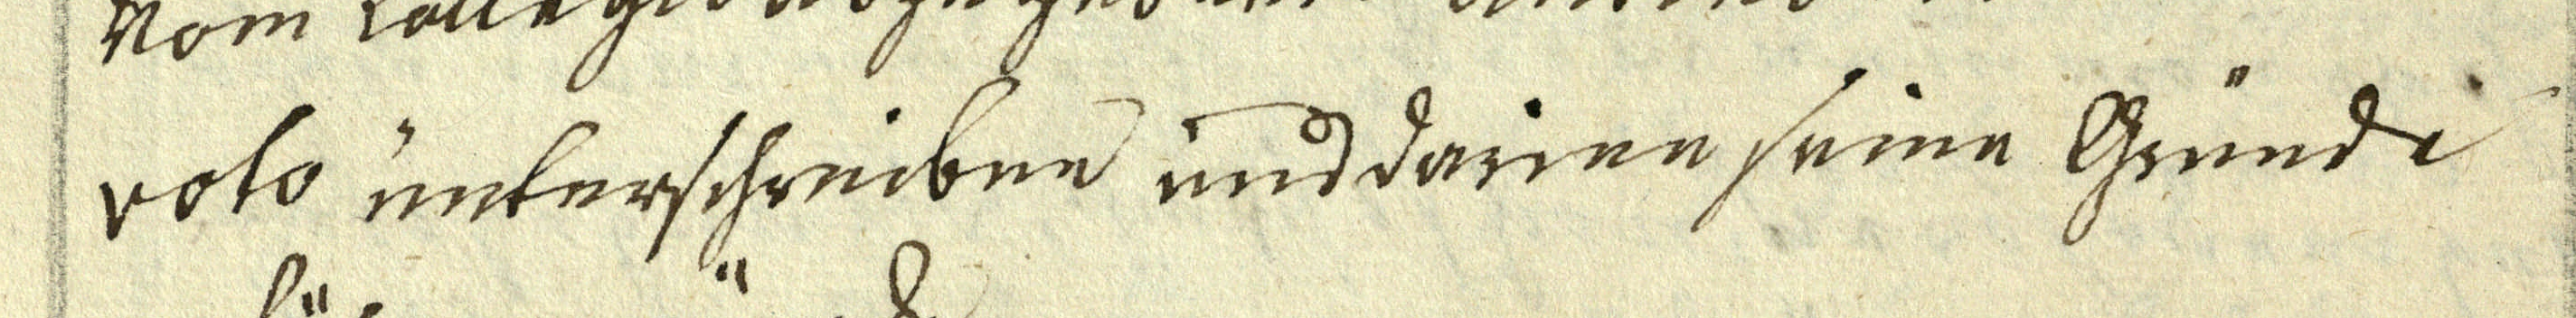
voto unterschreiben und darinn seine Gründe
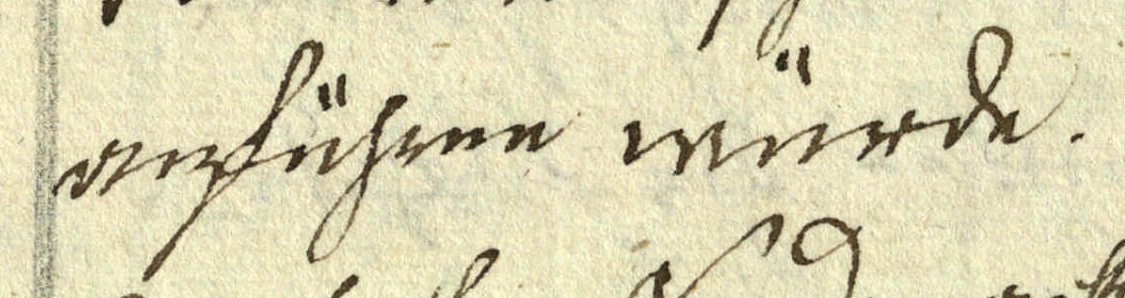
anführen würde.
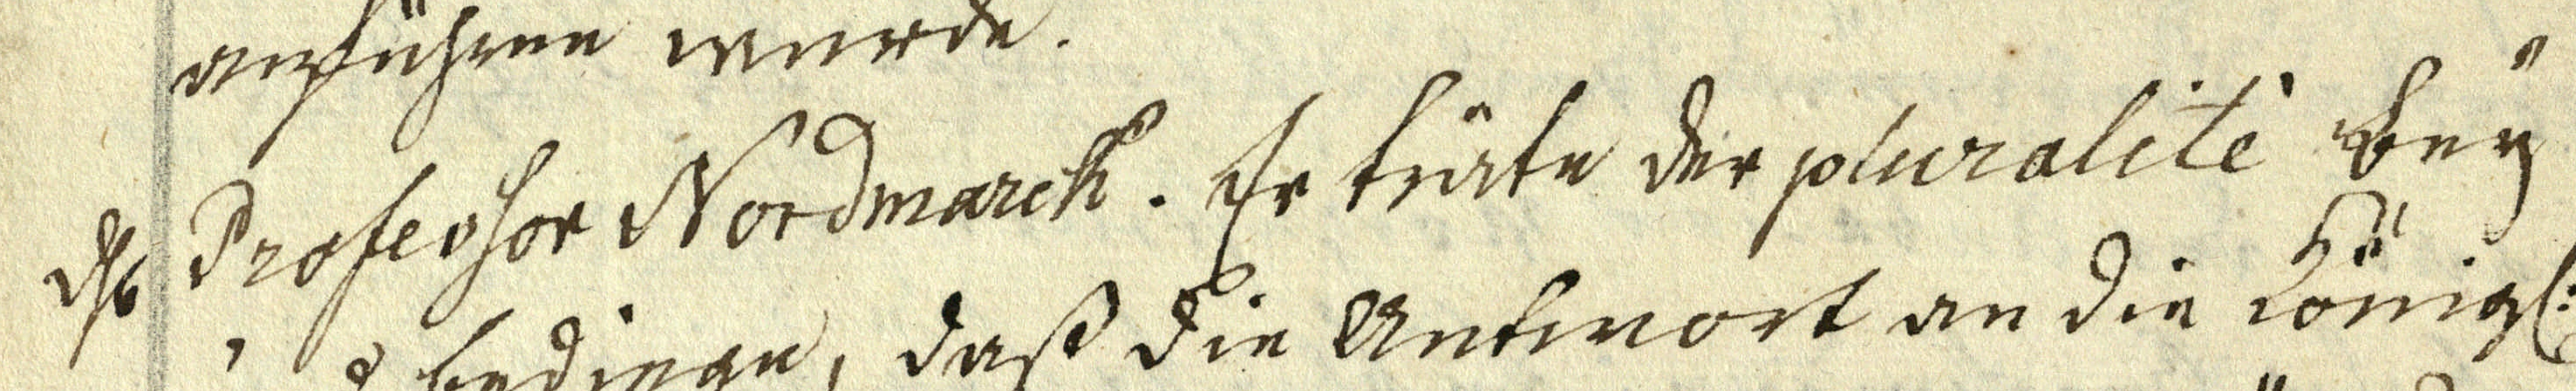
dh Professor Nordmarck. Er träte der pluralite beÿ
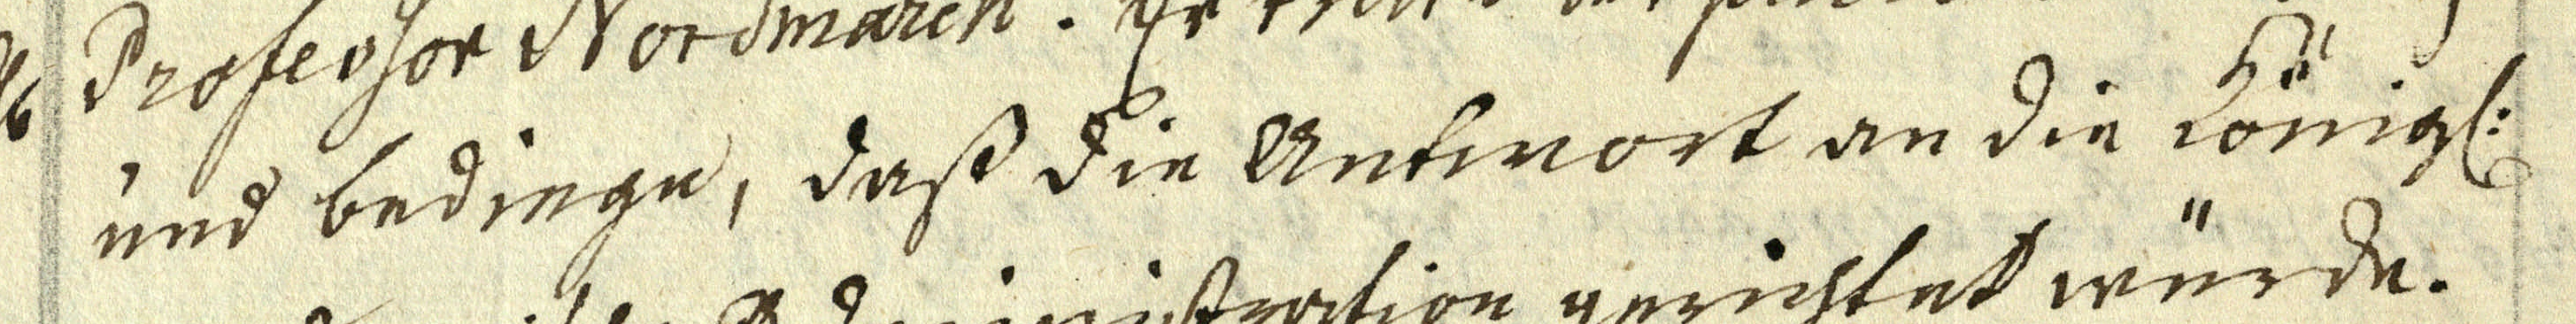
und bedinge, daß die Antwort an die Königl.
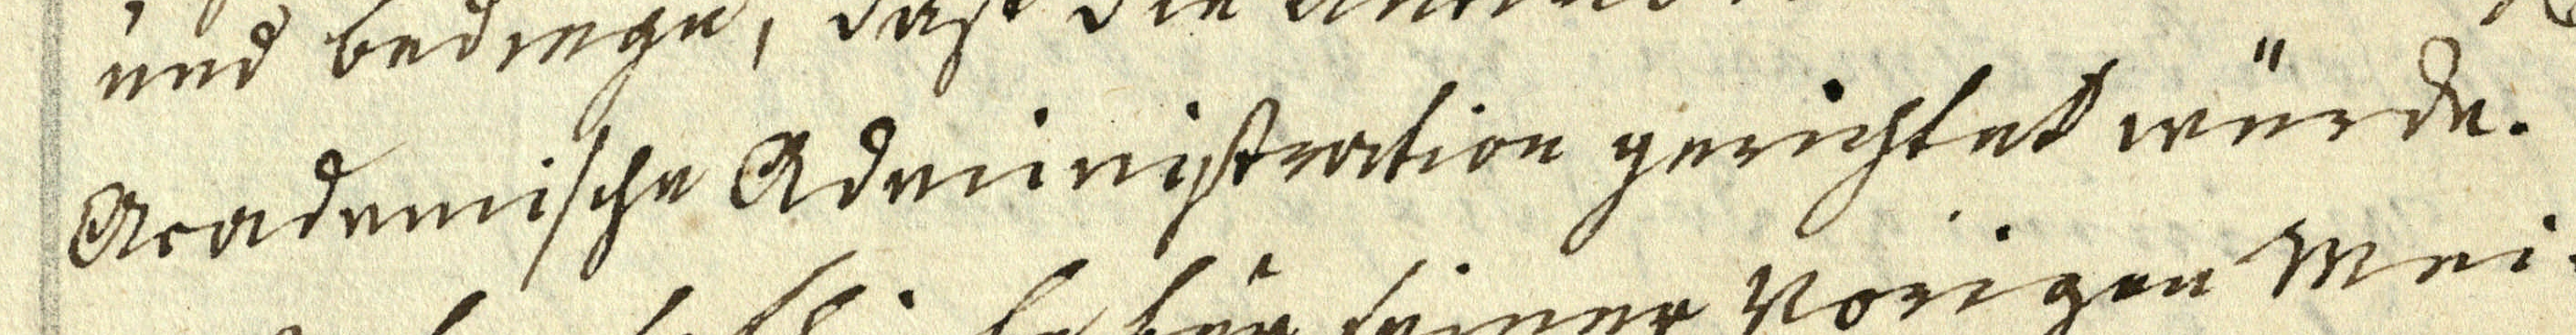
Academische Administration gerichtet würde.
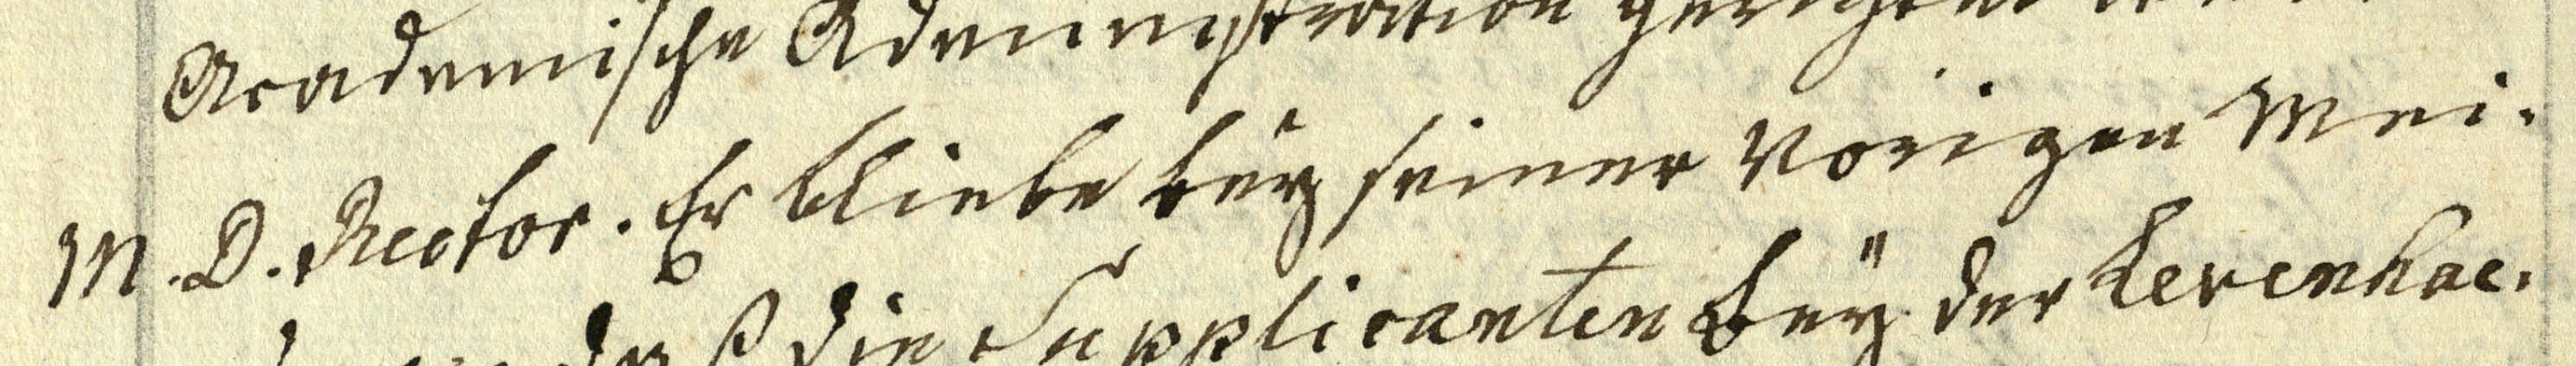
M. D. Rector. Er bliebe beÿ seiner vorigen Mei¬
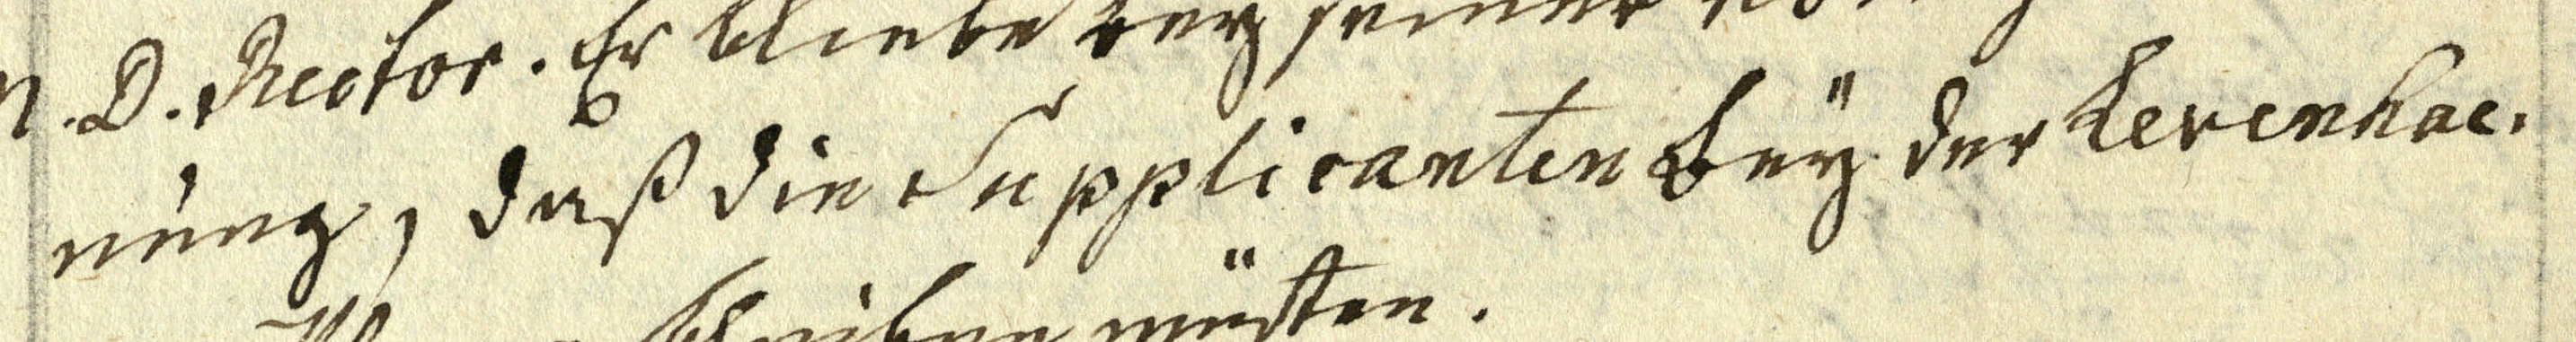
nung, daß die Supplicanten beÿ der Levenhae¬
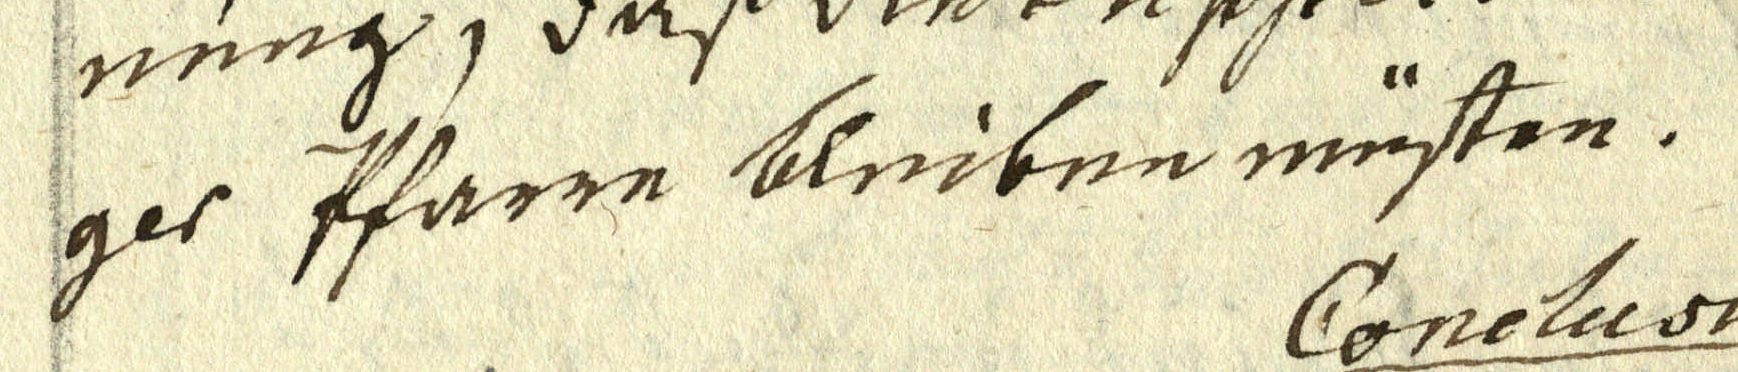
ger Pfarre bleiben müsten.
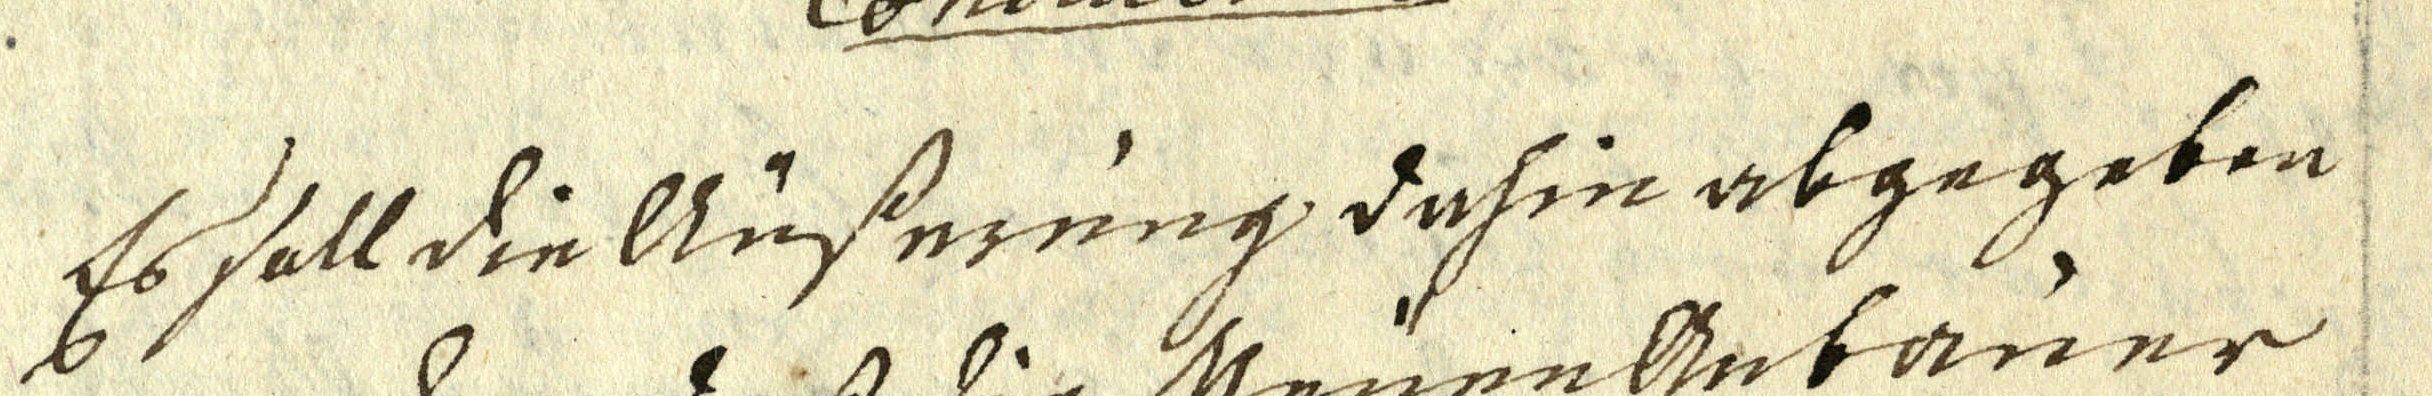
Es soll die Äußerung dahin abgegeben
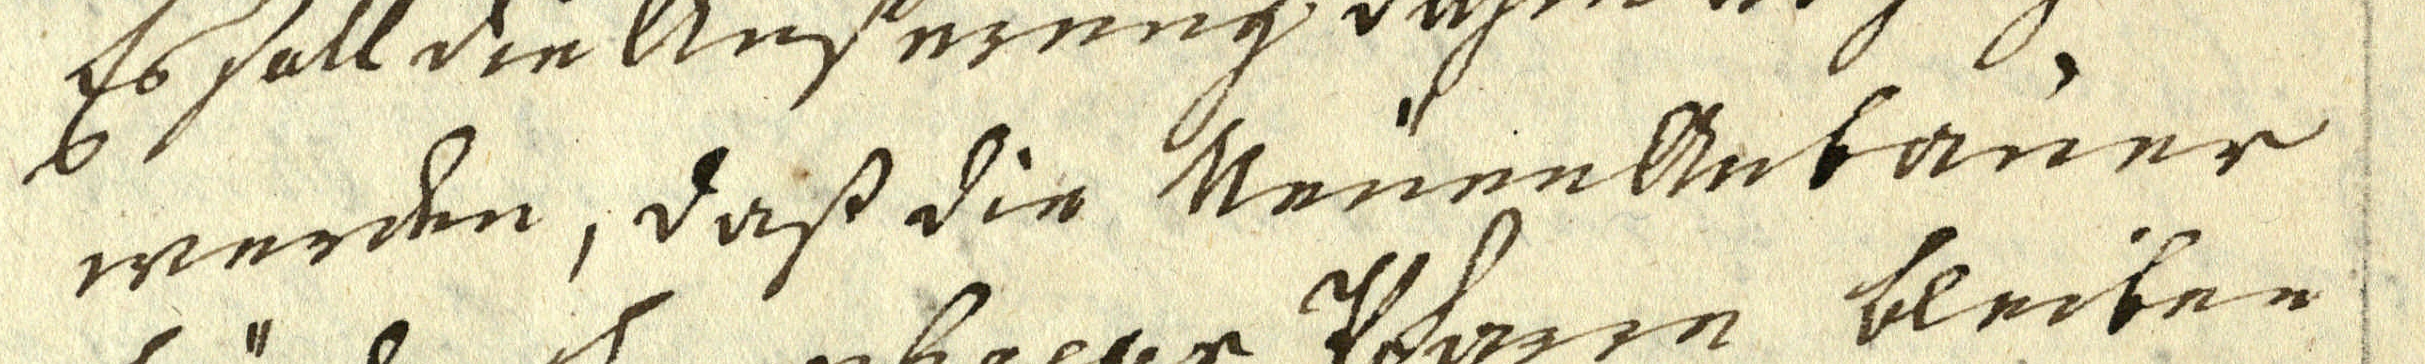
werden, daß die Neuen Anbauer
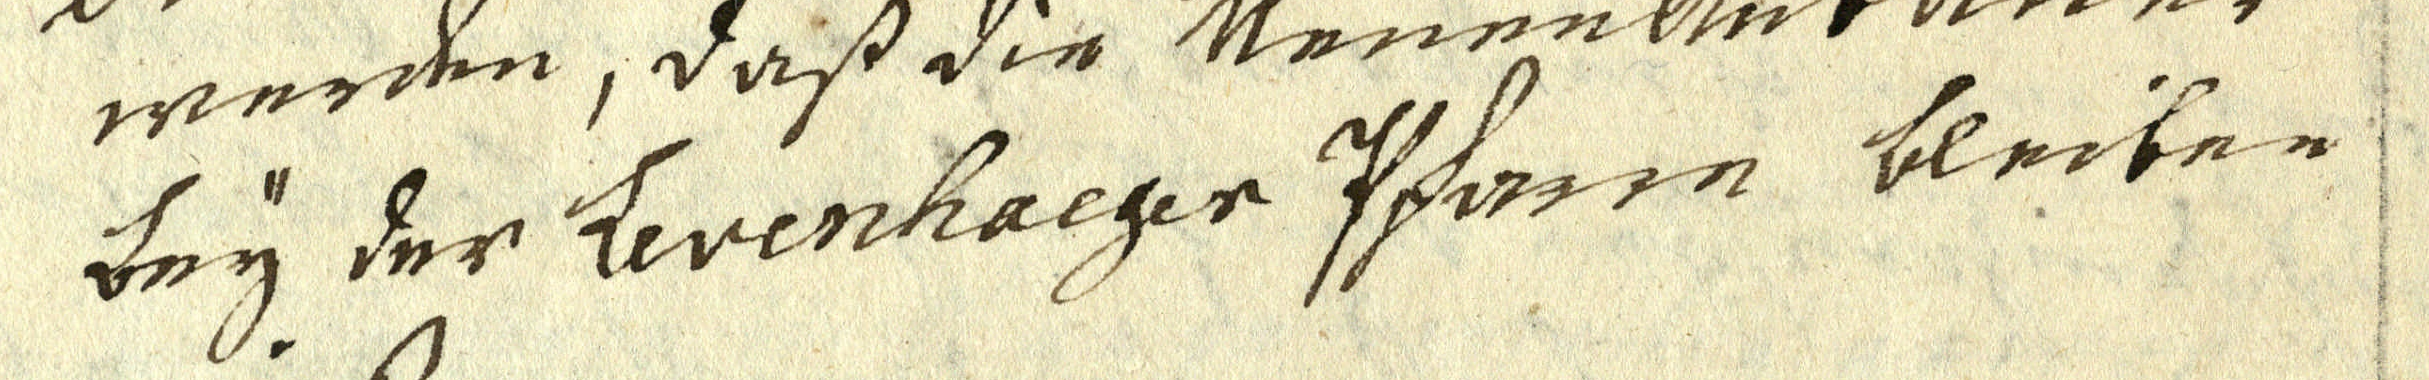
beÿ der Levenhaeger Pfarren bleiben
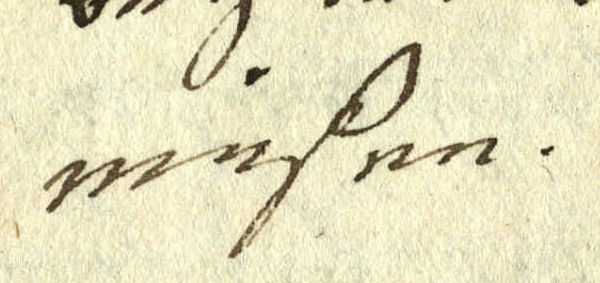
müßen.
